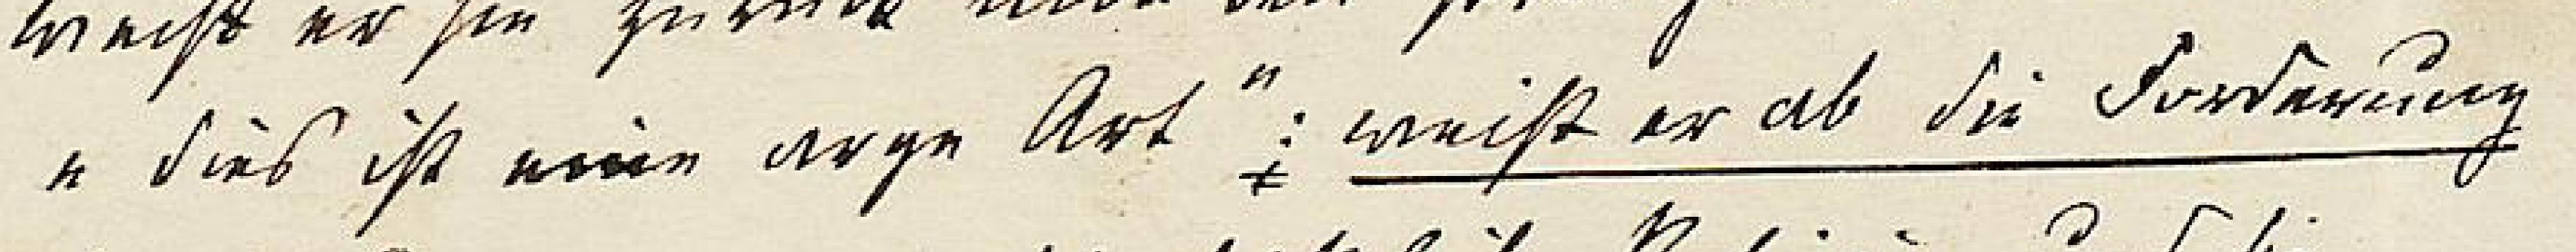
"dies ist eine arge Art": weißt er ab die Forderung
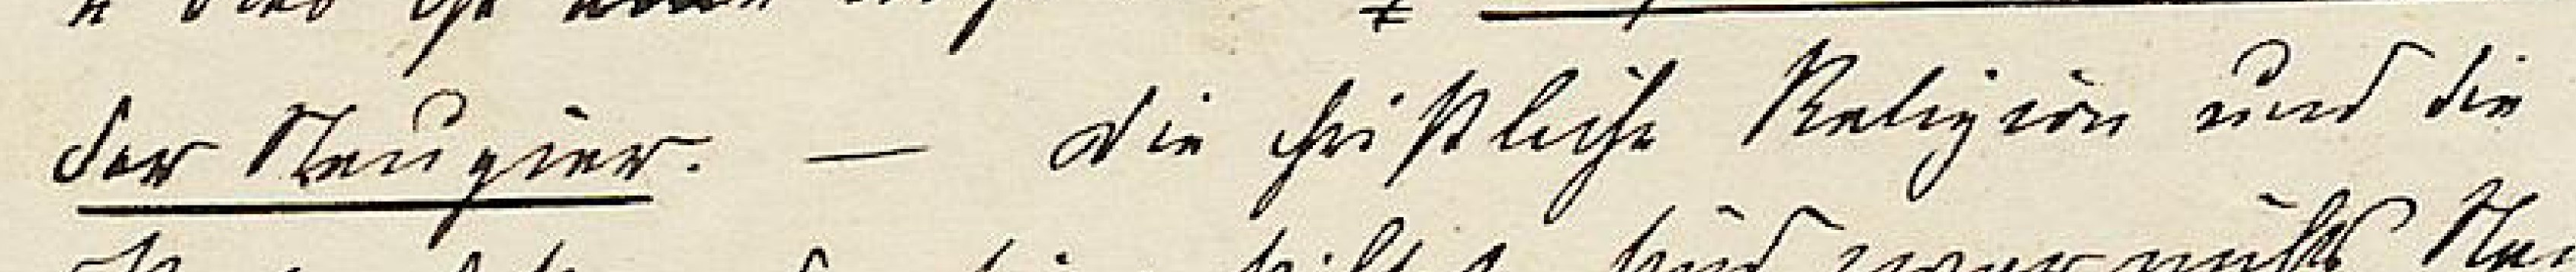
der Neugier. _ Die christliche Religion und die
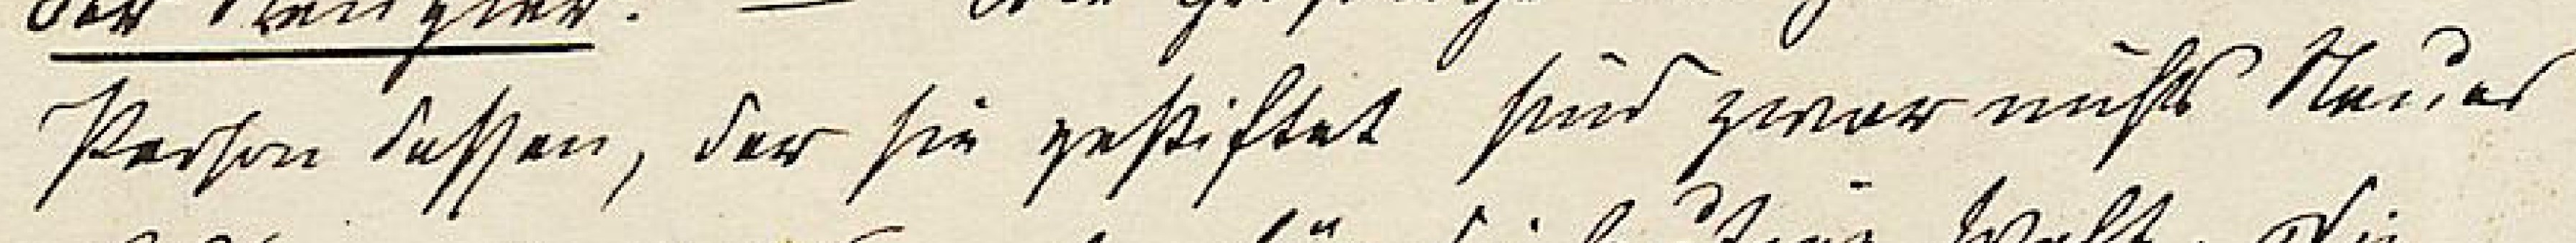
Person dessen, der sie gestiftet sind zwar nichs Neues
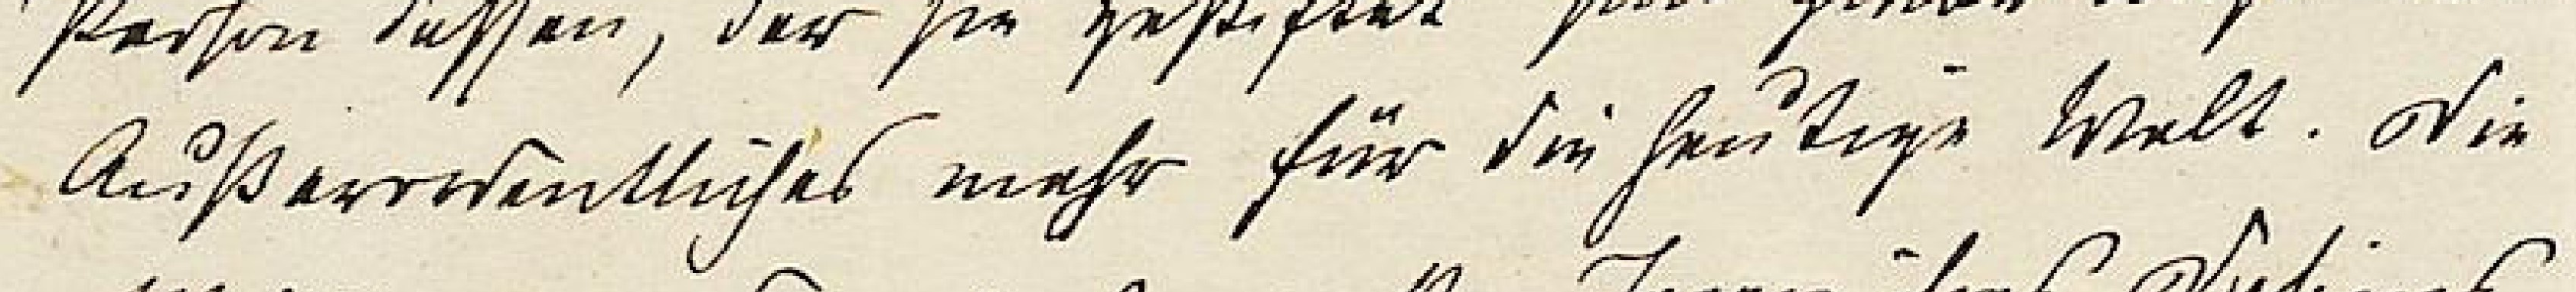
Außerodentliches mehr für die heutige Welt. Die
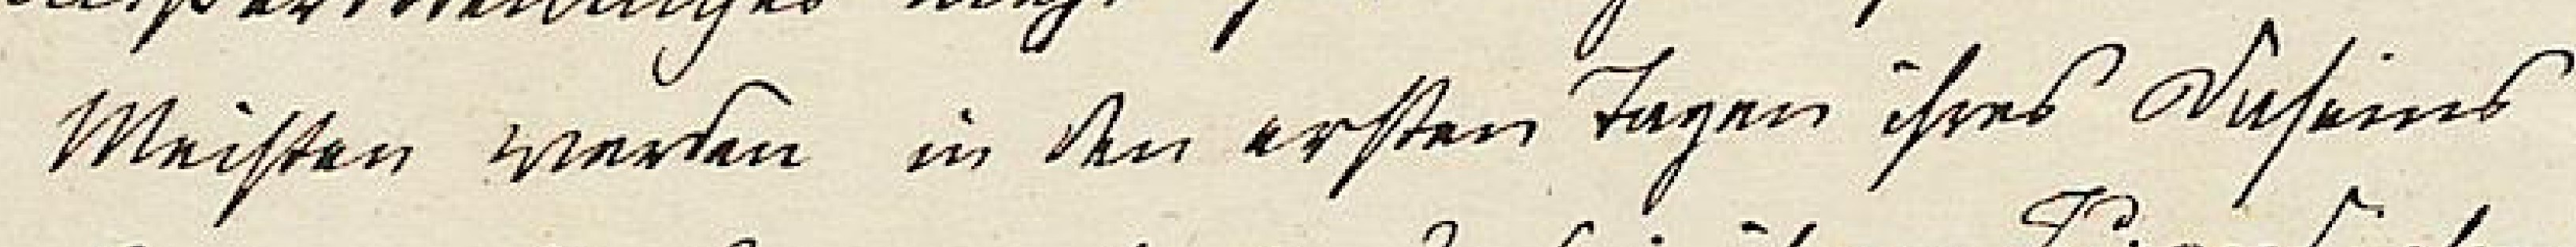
Meisten werden in den ersten Tagen ihres Daseins
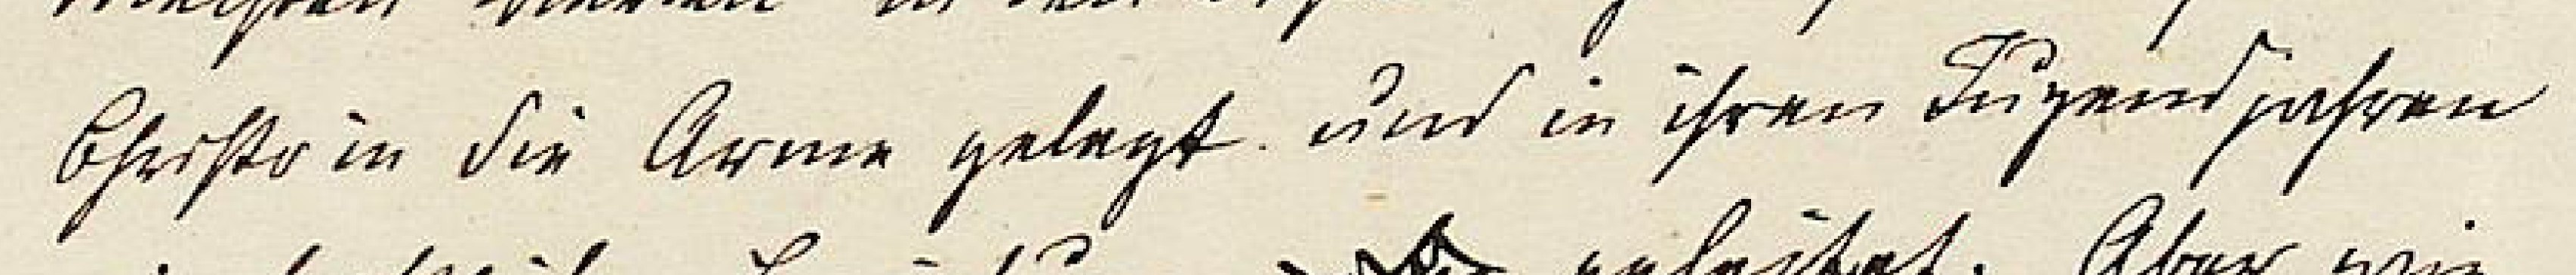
Christo in die Arme gelegt und in ihren Jugendjahren
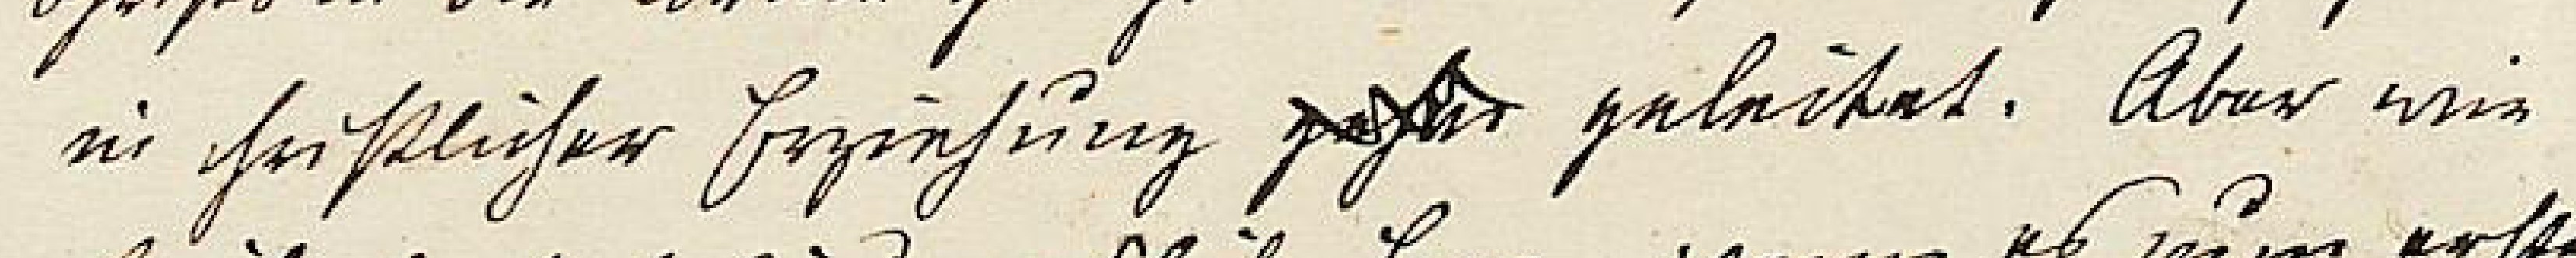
in christlicher Erziehung jeher geleitet. Aber wie
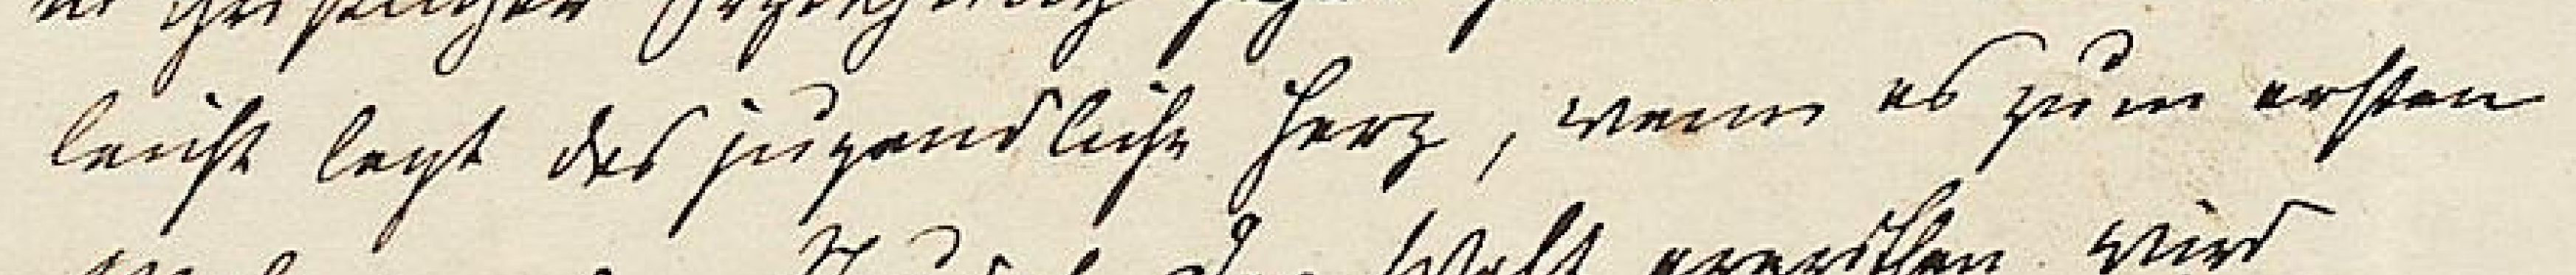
leicht legt das jugendliche Herz, wenn es zum ersten
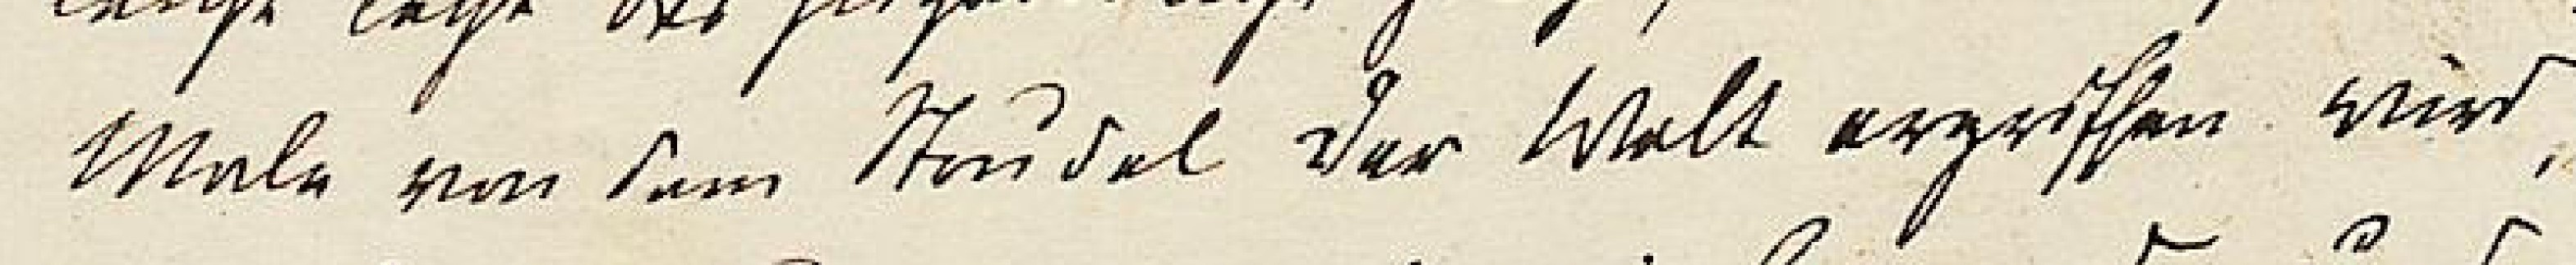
Male von dem Strudel der Welt ergriffen wird,
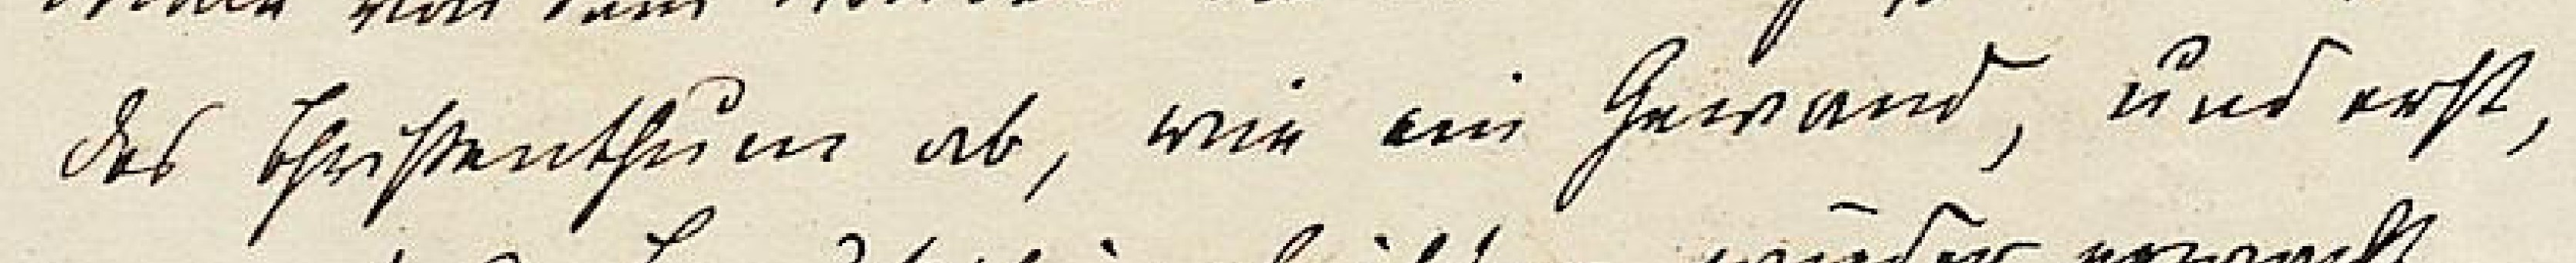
das Christenthunm ab, wie ein Gewand, und erst,
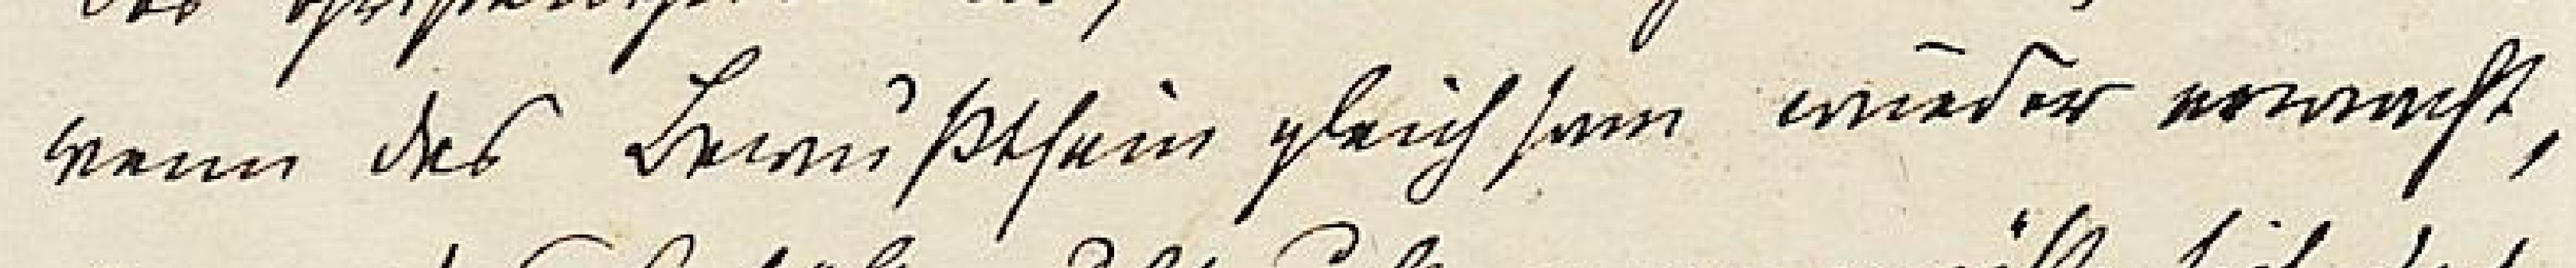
wenn das Bewußtsein gleichsam wieder erwacht,
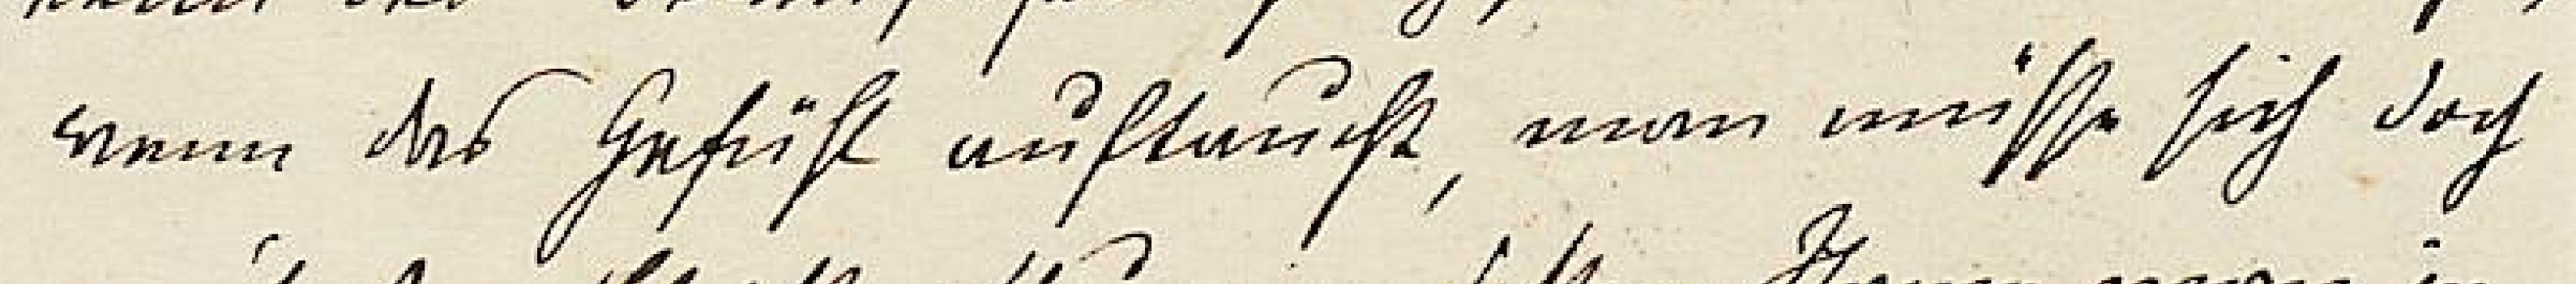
wenn das Gefühl auftaucht, man müsse sich doch
